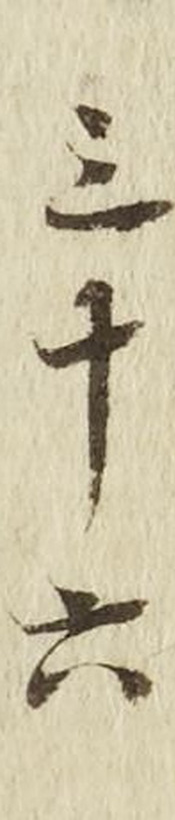三十六
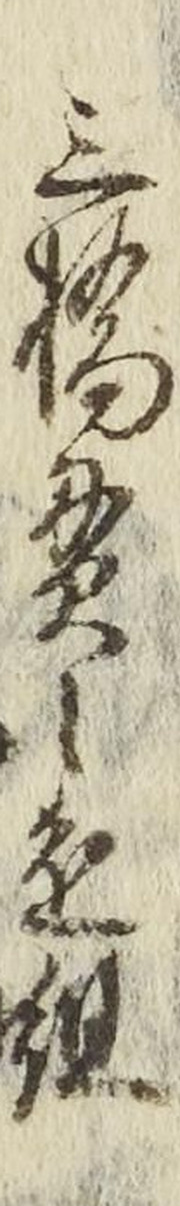三橋貫之進組
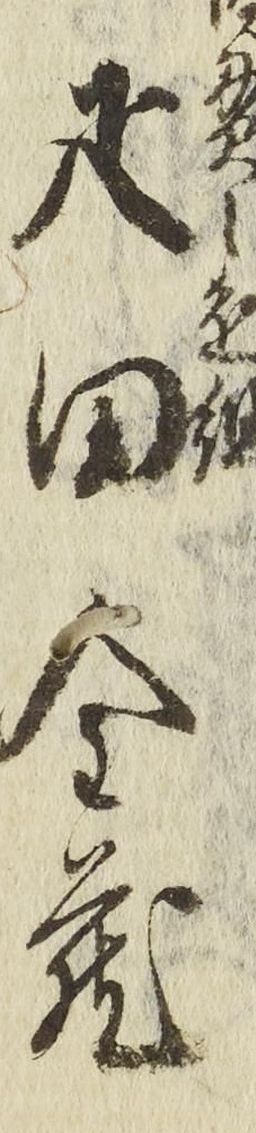疋田金蔵
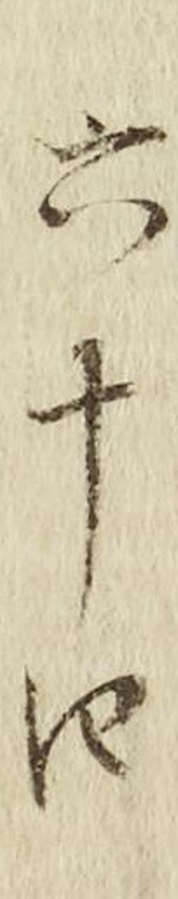六十四
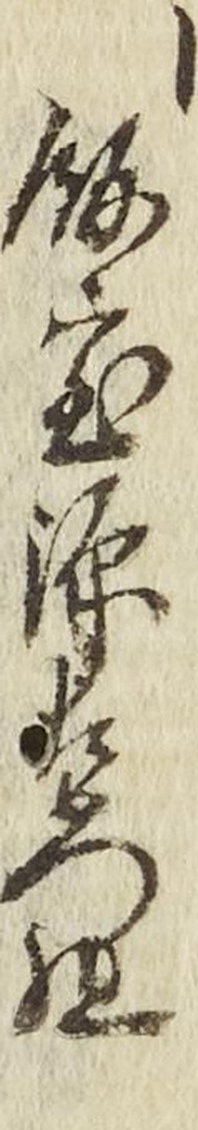飯室源左衛門組
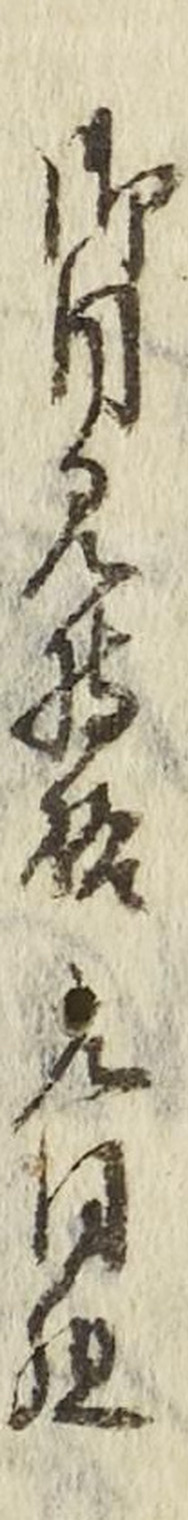御用見持格元同組
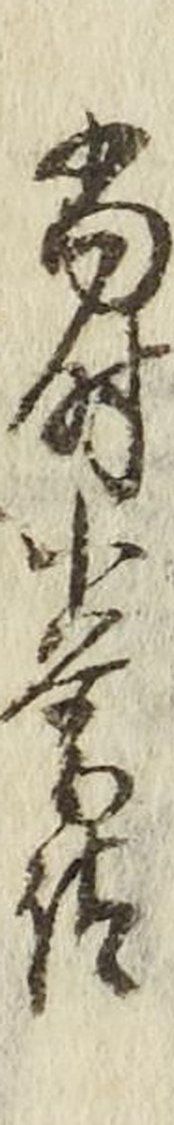当時小普請
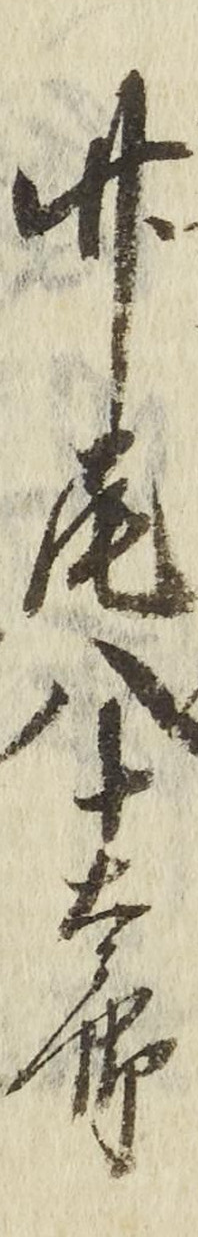竹尾八十太郎
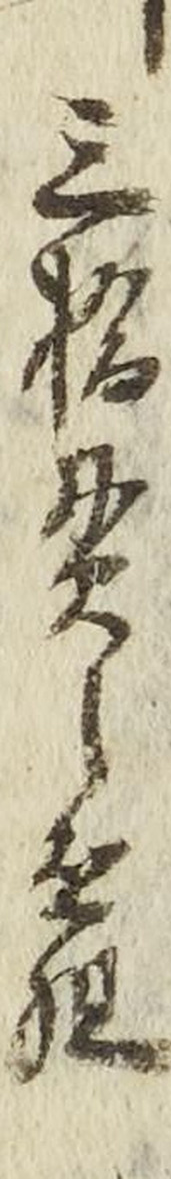三橋貫之進組
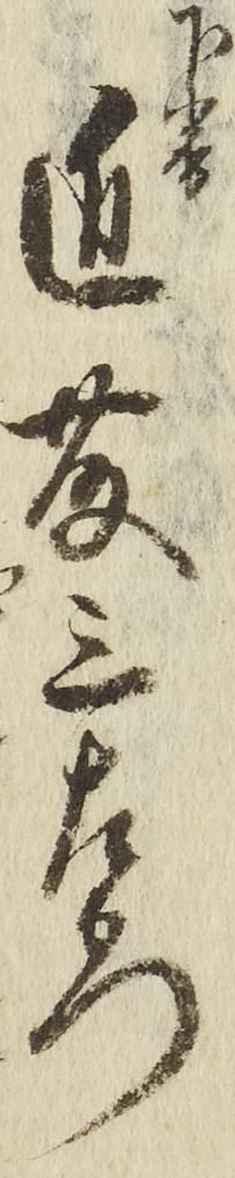近藤三左衛門
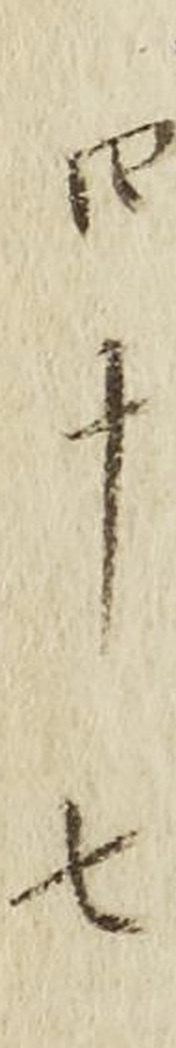四十七

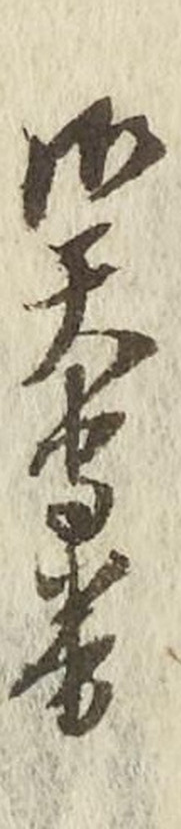御天守番
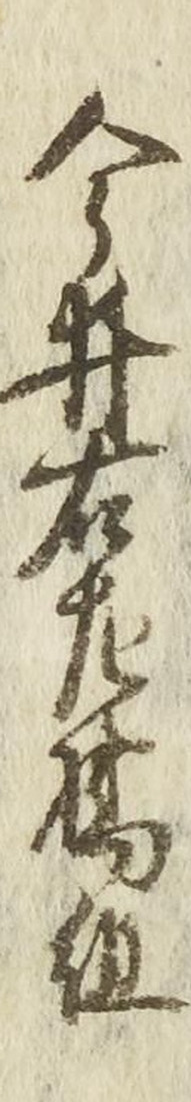今井右左橋組
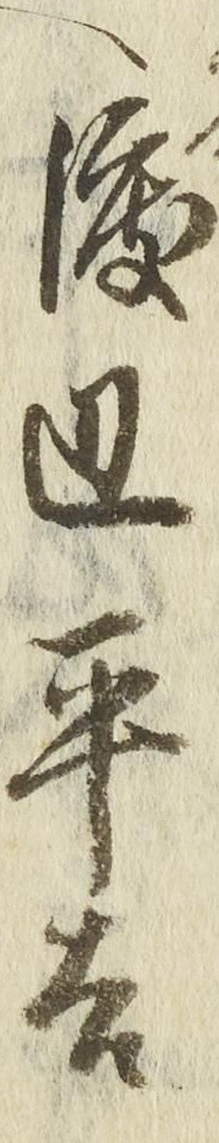渡辺平太
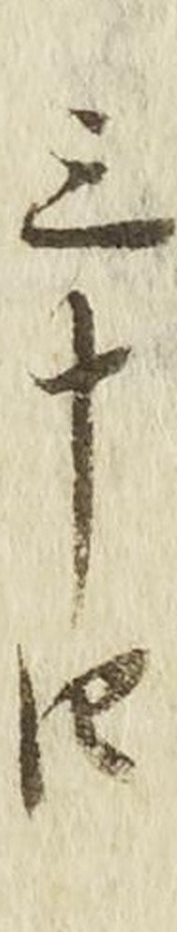三十四
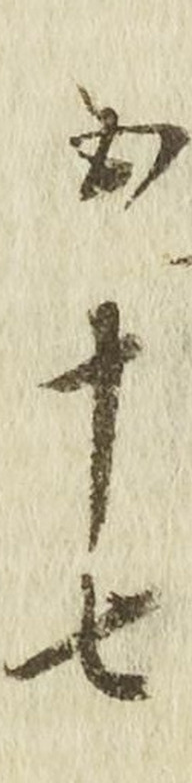五十七
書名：世説ヤンレフシ写、駿州田中城地震ニ付内外破損御届書、豫州大洲城地震ニ付内外破損御届書・封廻状
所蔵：東京大学地震研究所図書室 Earthquake Research Institute Library, The University of Tokyo, JAPAN
